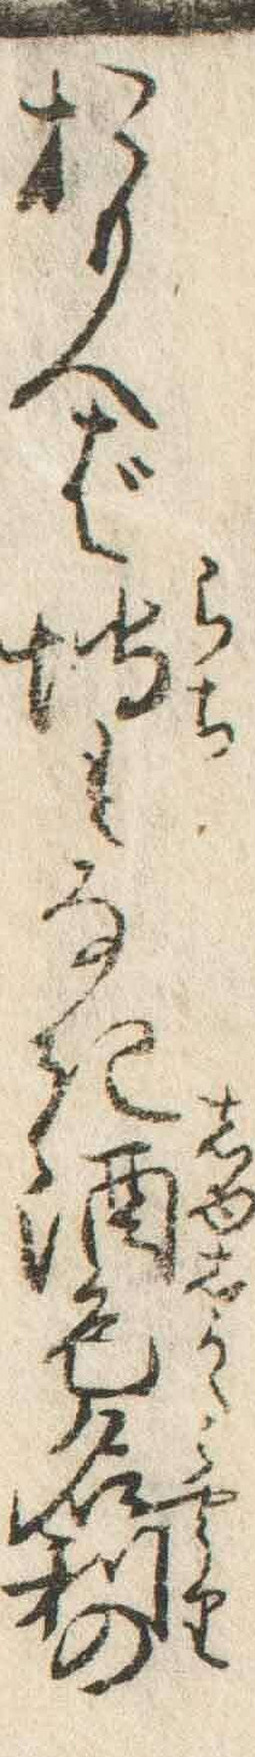おもへば埒もなき酒色名利の
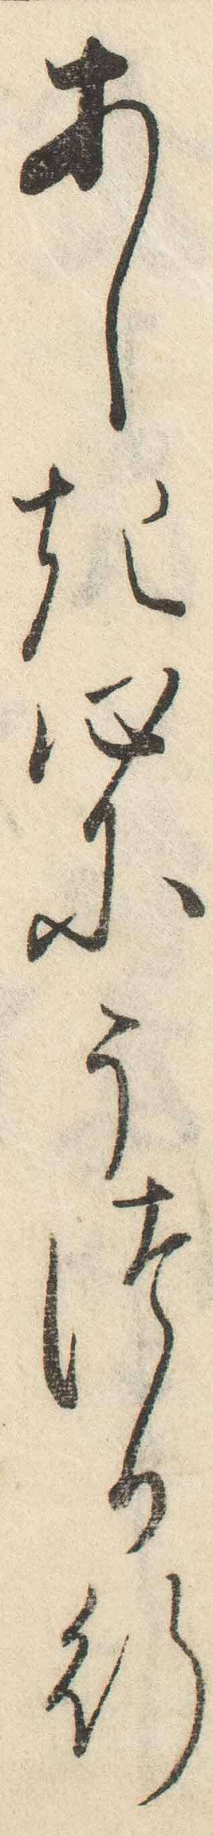あしき心にうつり行
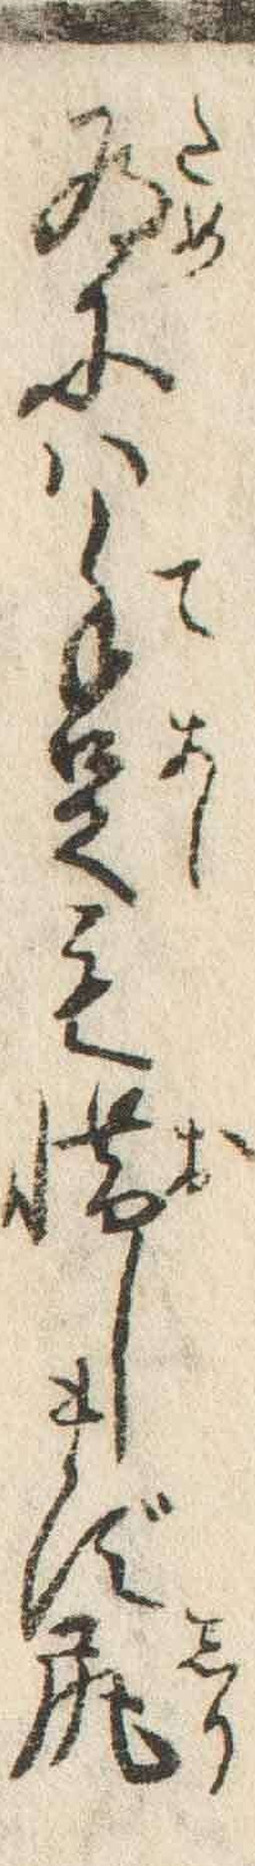為には手足も惜しまず尻
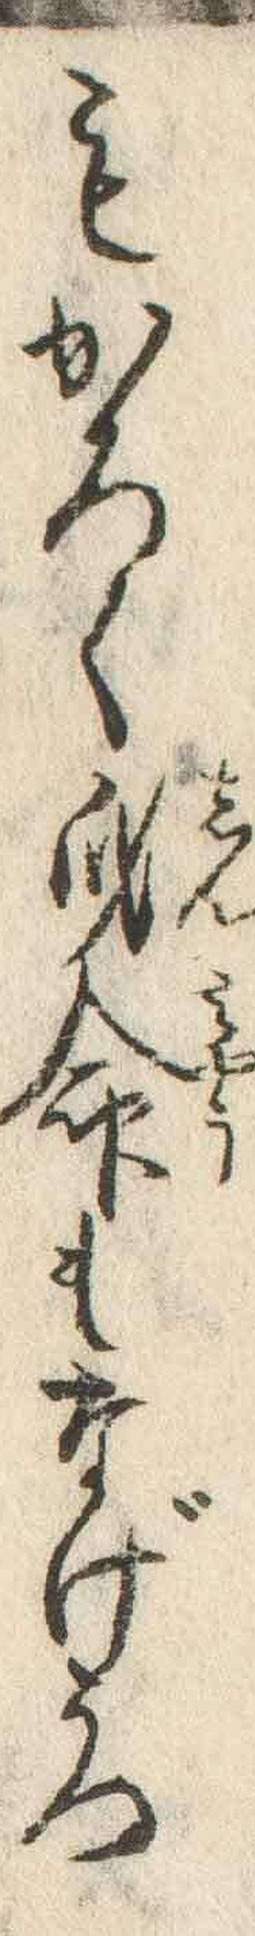もかろく身命もなげうつ
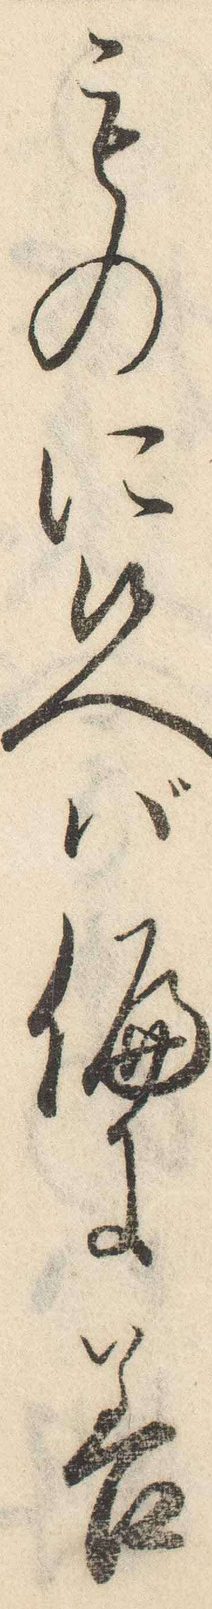ものに候へば偏に善
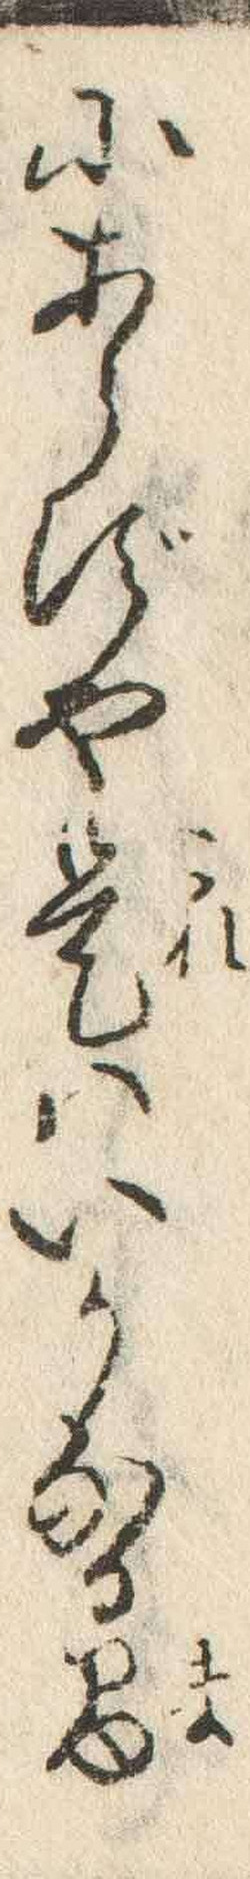にあらずや是はいかなる間
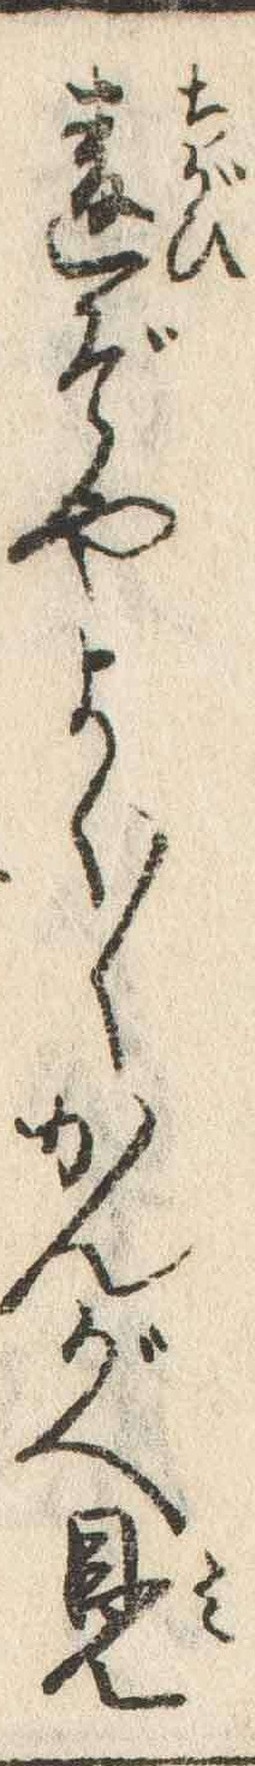違ぞやよく〳〵かんがへ見
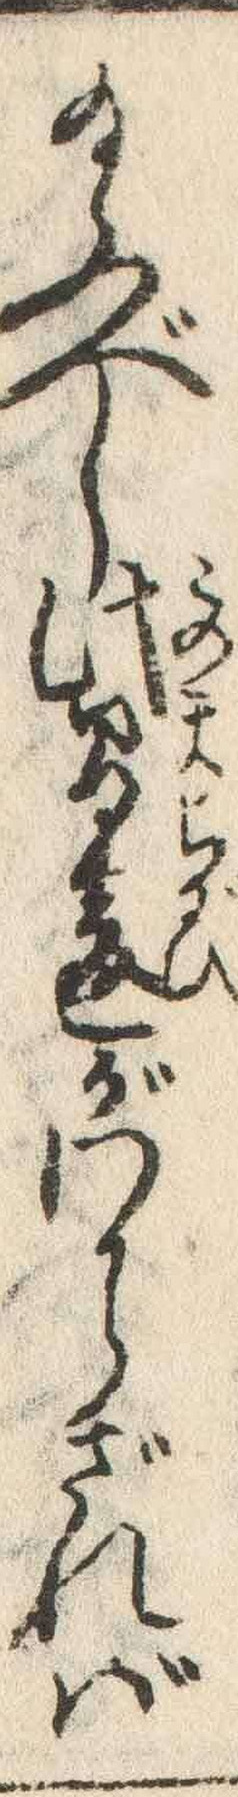給ふべし此間違がわからざれば
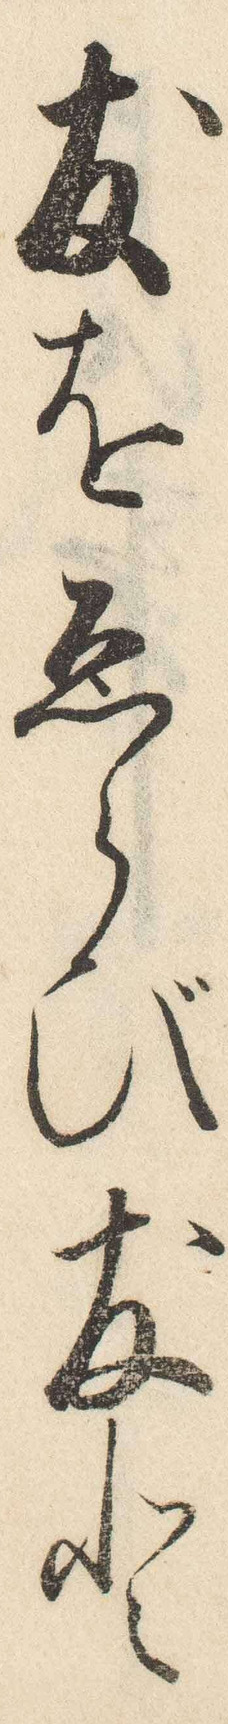友をゑらび友と
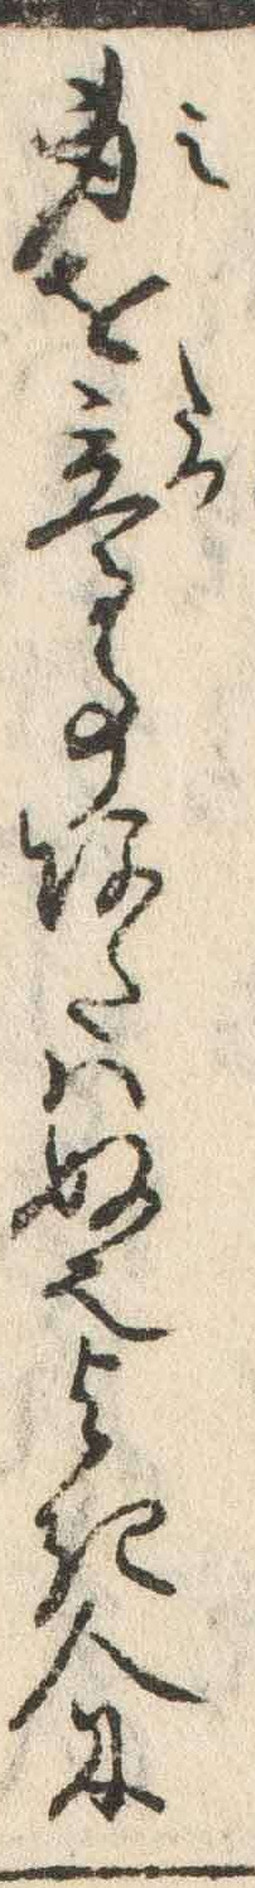身を立る事あたはぬ也よき人に
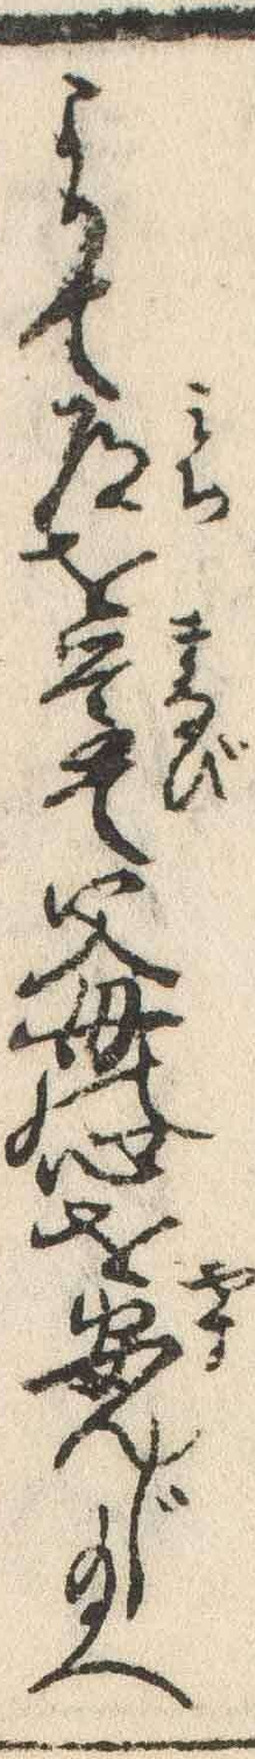よりて道を学て父母の心を安んじ給へ
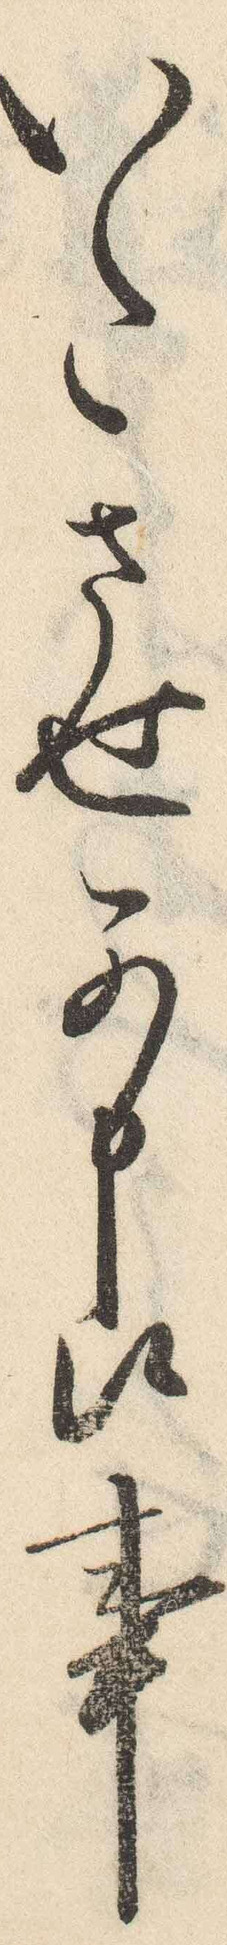いたさせ可申候事

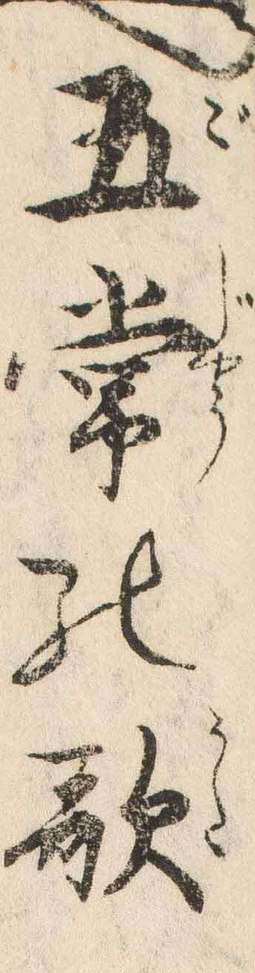五常の歌
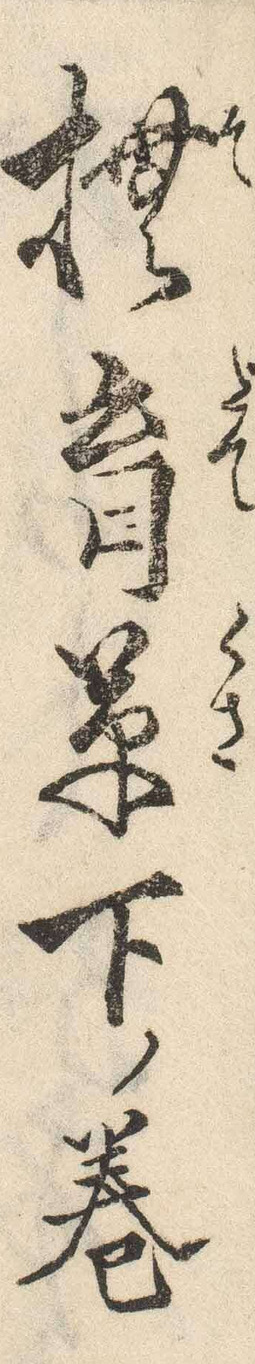撫育草下ノ巻
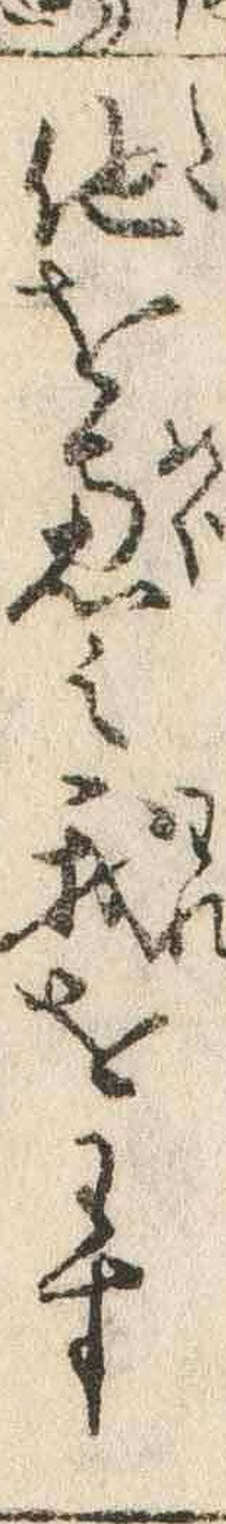他を恵み我をわす
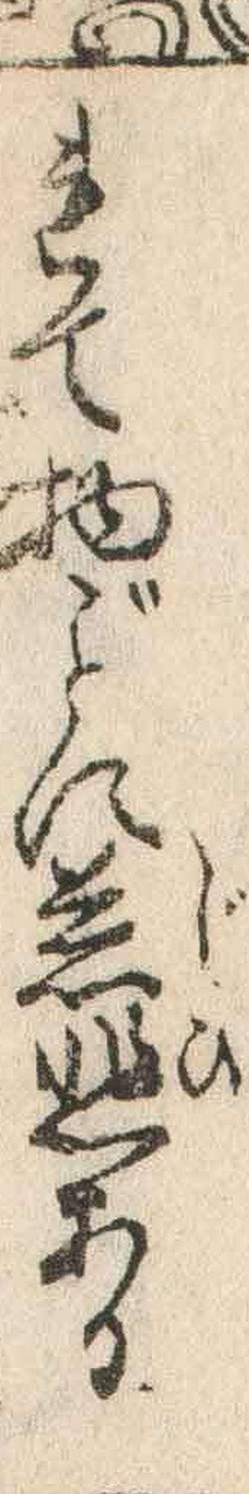仁れて物ごとに慈悲ある
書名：撫育草
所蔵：東京学芸大学附属図書館 国文学研究資料館
